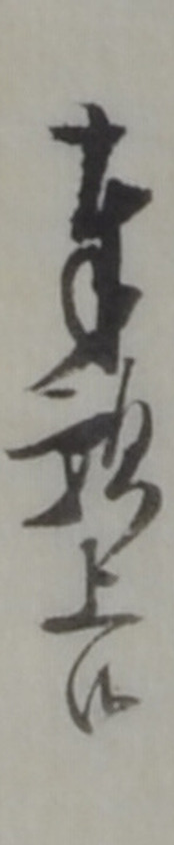奉願上候

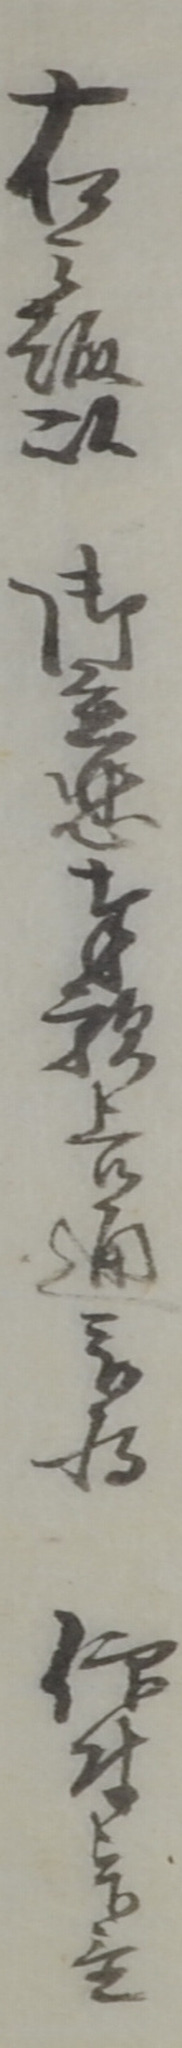右之趣以御慈悲奉願上候通被為仰付被下置
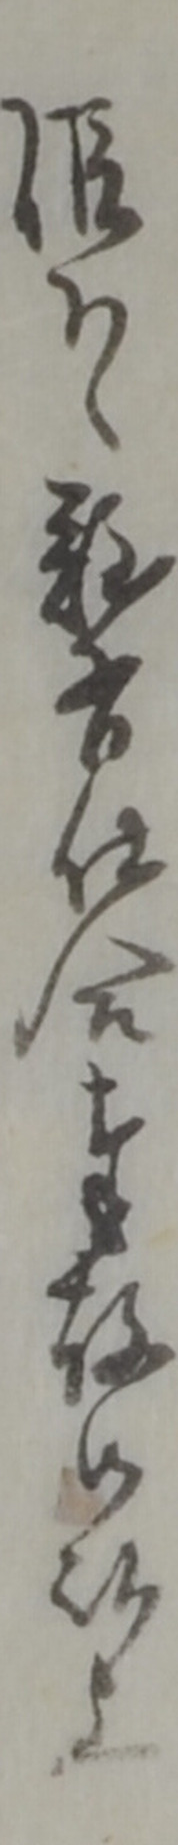候ハヽ難有仕合奉存候以上
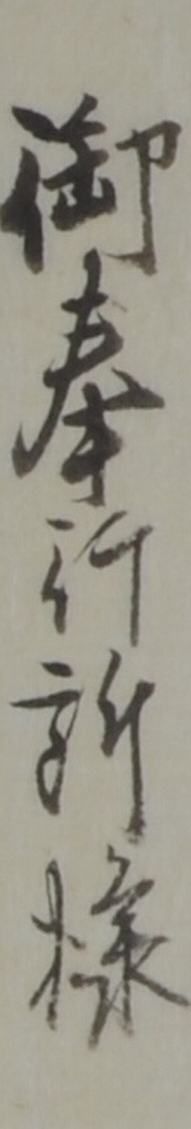御奉行所様
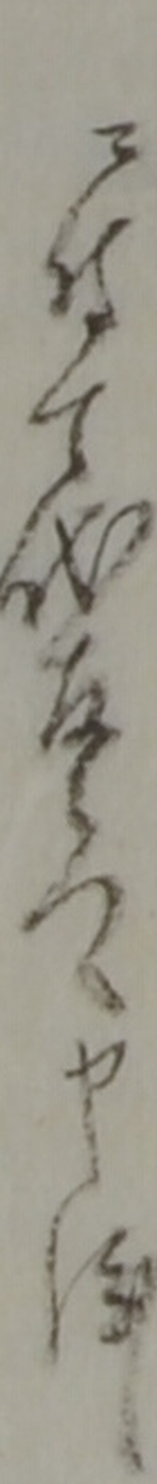ニ付丁代友右衛門へ申渡候
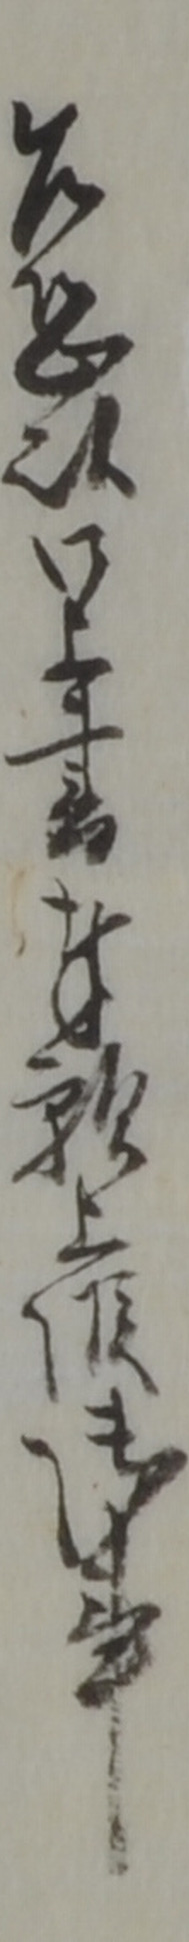乍恐以口上書奉願上候御事
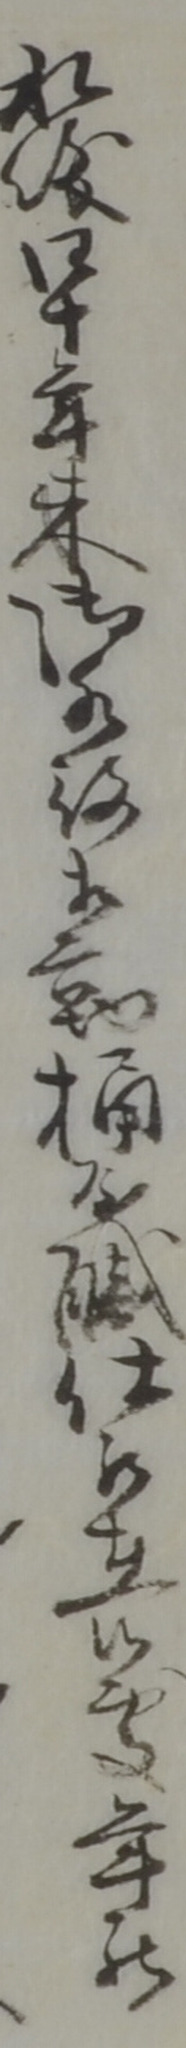私儀四十年来御水役相勤桶屋職仕罷在候處年罷
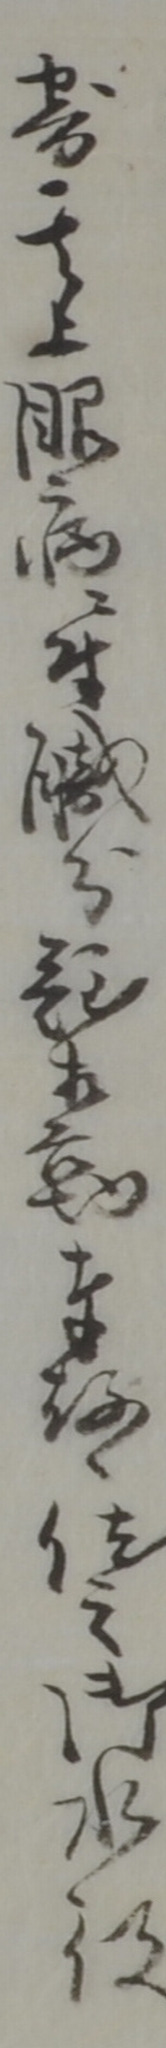寄其上眼病ニ付職分難相勤奉存候依之御水役
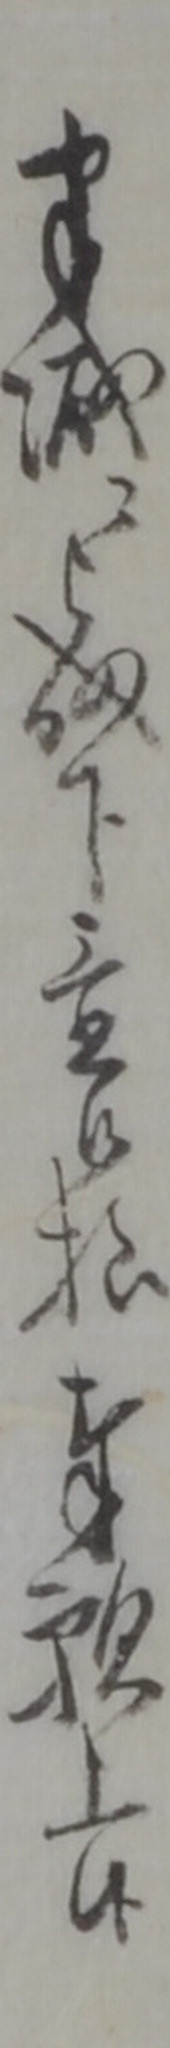半減ニ被成下置候様奉願上候
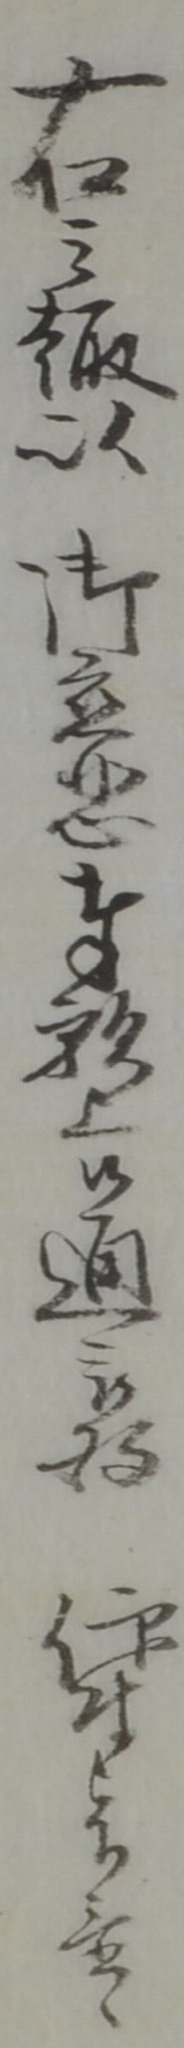右之趣以御慈悲奉願上候通被為仰付被下置候
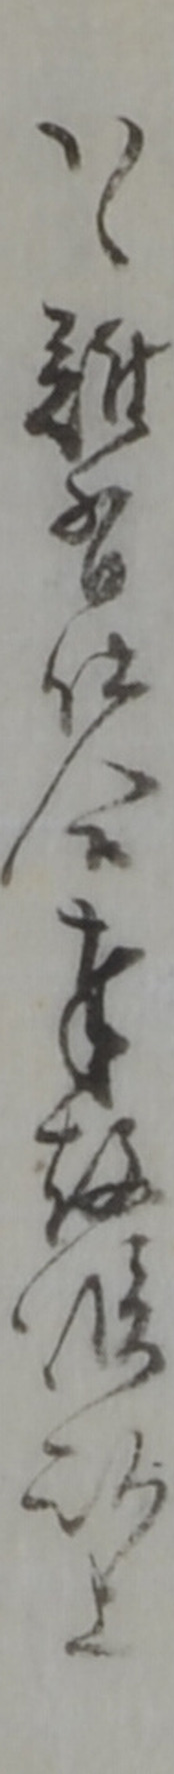候ハヽ難有仕合奉存候以上
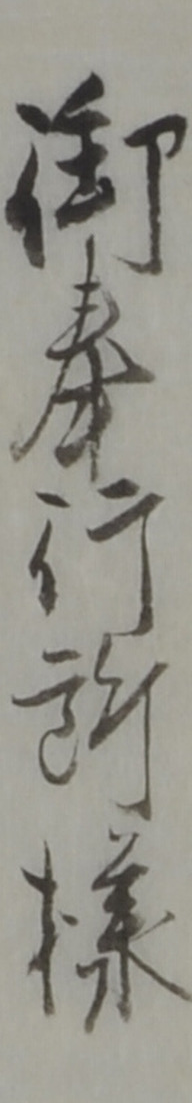御奉行所様
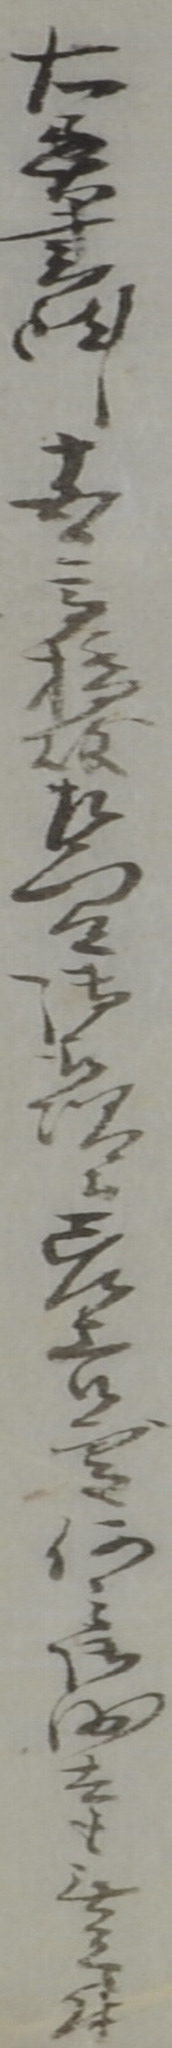右奥書致し十五日高橋礒左衛門殿御取次ニ而差上候處何之御沙汰も無之ニ付
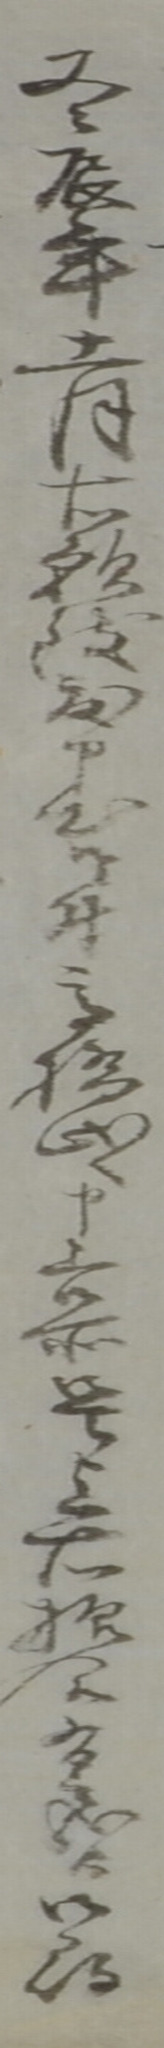又々辰年十一月右願致度申出候二付高橋氏申上候所是迄右様合有之哉と御尋
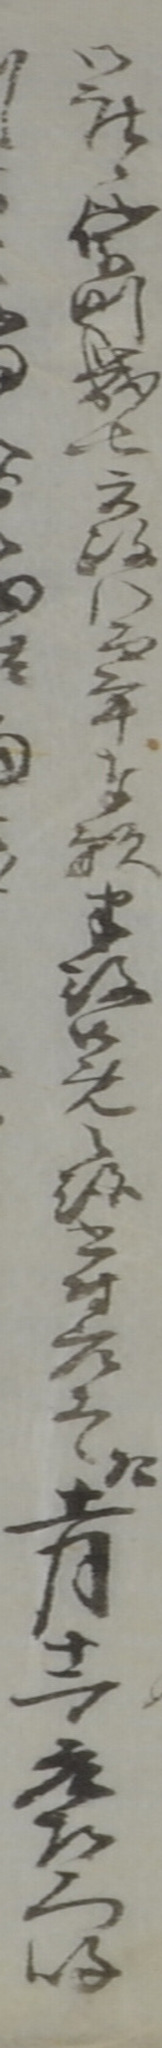御座候袋町幾七文政八酉年奉願半役御免之趣書付差上候同十一月十二日庄左衛門呼
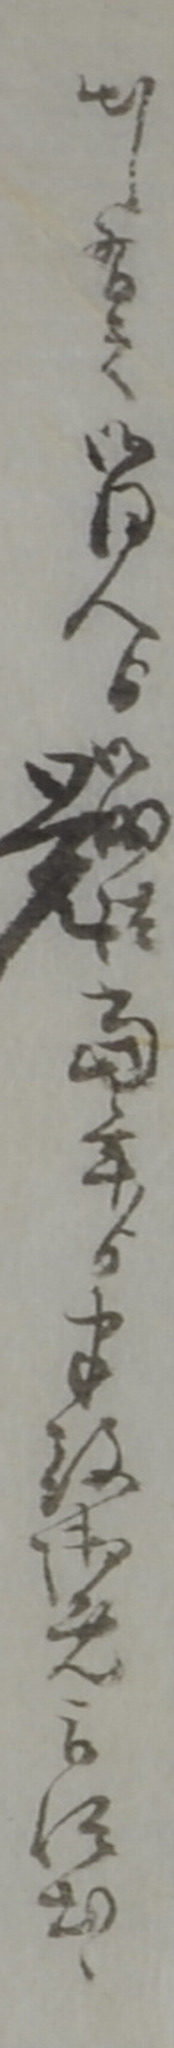出し有之御同人ゟ御沙汰当年ゟ半役御免被仰出候
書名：諸願書控簿
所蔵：伊那市立高遠町図書館・合同会社AMANE
